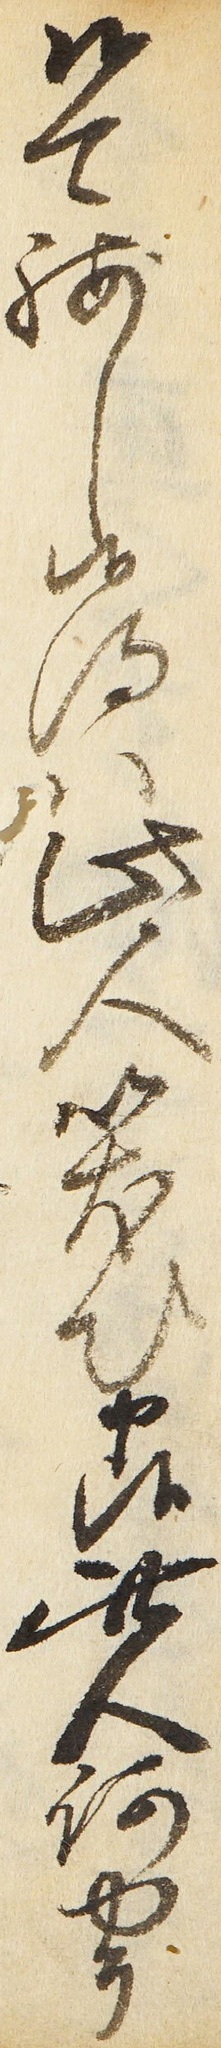候て残し候得ハ此人笑ひ申候此人何やう
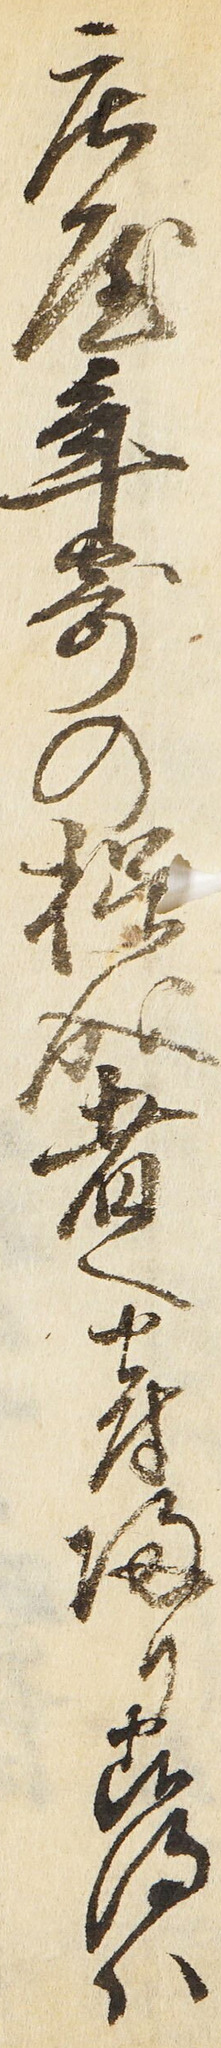庄屋年寄の様成者へ申付帰り申候得ハ
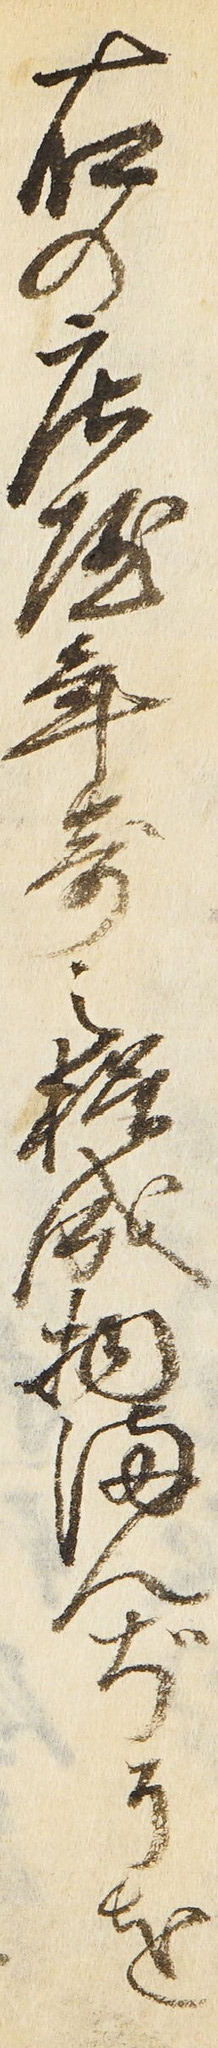右の庄屋年寄之様成物まんぢうを
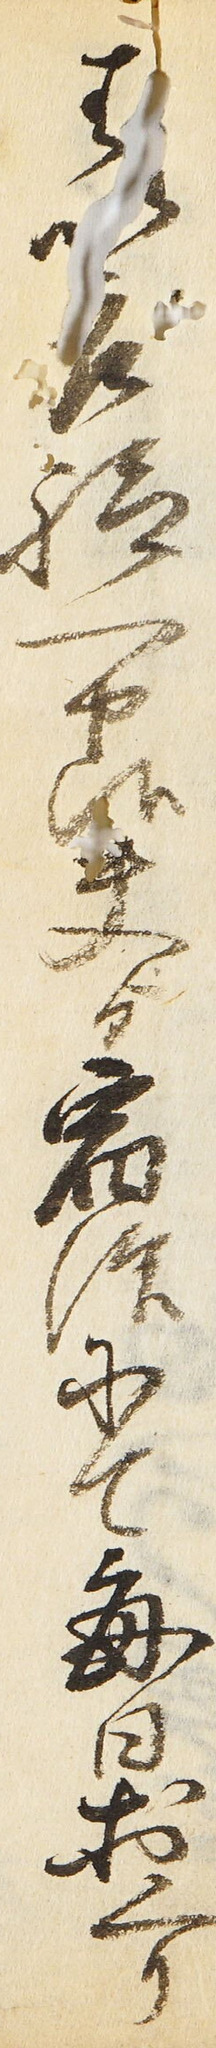は給へ申候夫ゟ宿次にて毎日おくり
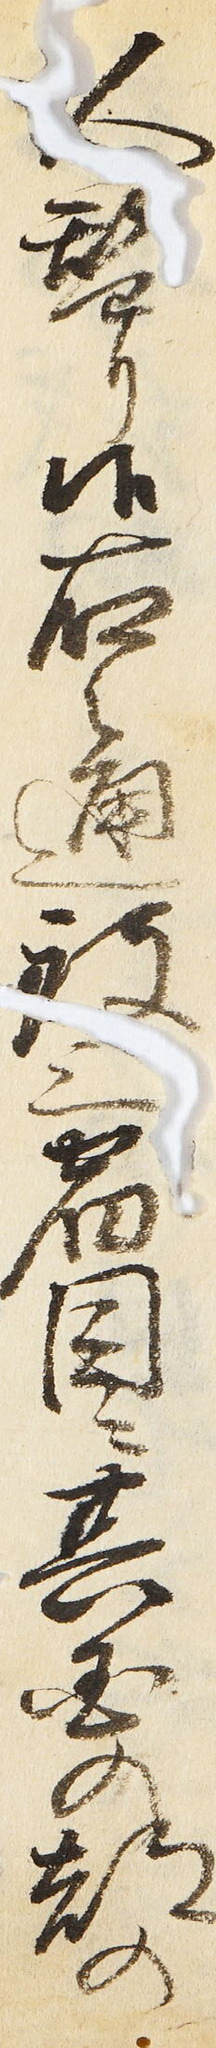人替り候右之通致上宿目ニ其国の都の
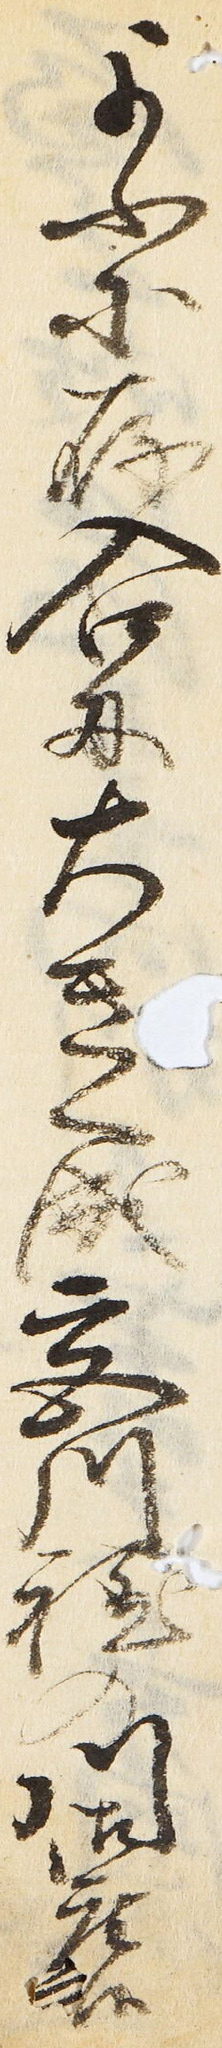よふに存入口に大きく成宮川程の川御座候
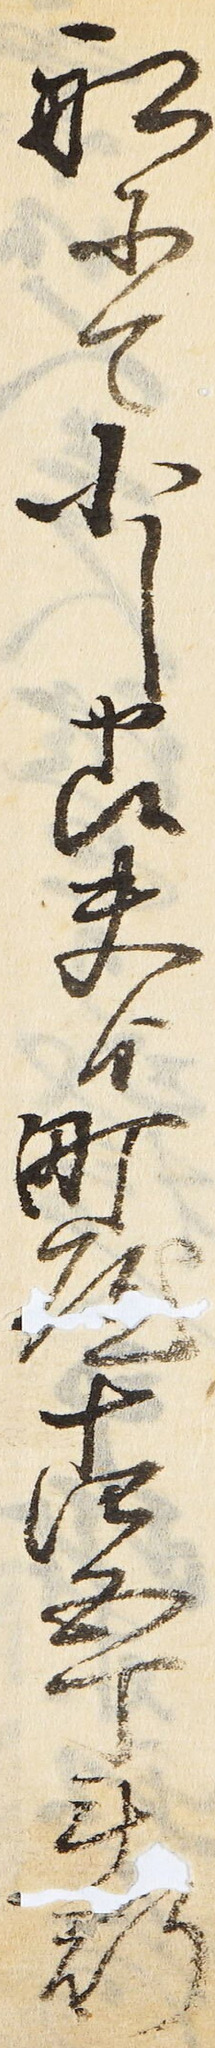船にてこし申候夫ゟ町屋十四五丁計行
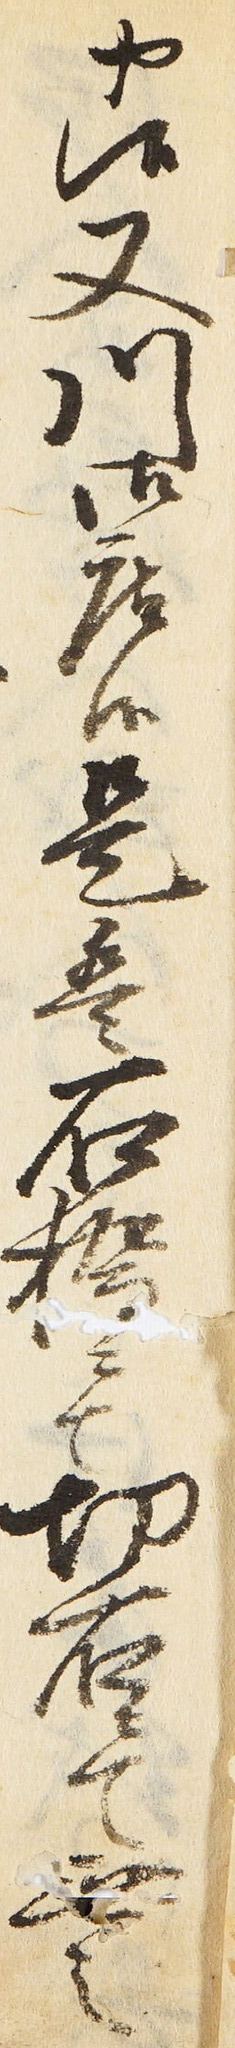申候又川御座候是は石橋ニて切右ニて無之
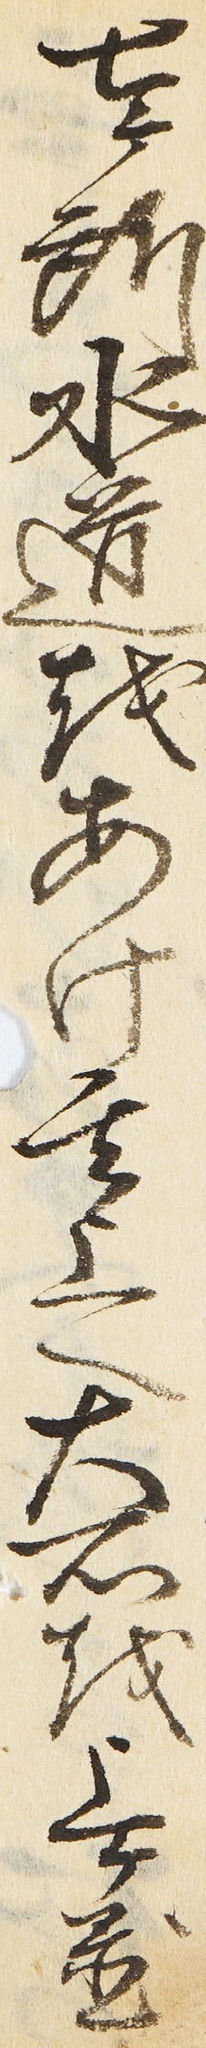七ヶ所水道をあけ其上へ大石を上ケ置
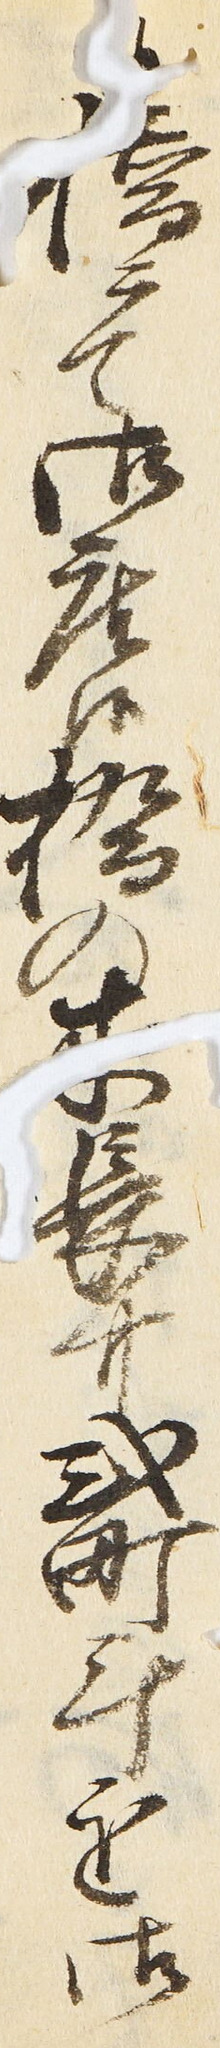橋ニて御座候橋の長サ弐町計を御
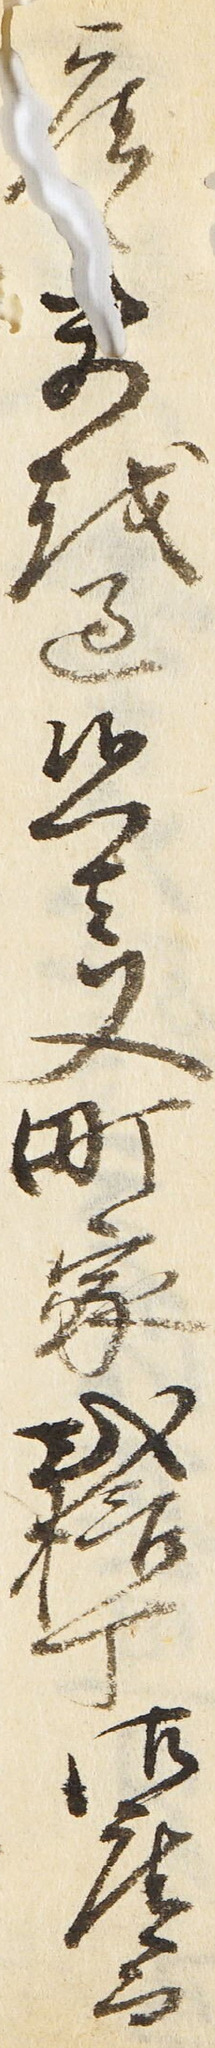座候夫を過候へは又町家弐拾丁御座候而
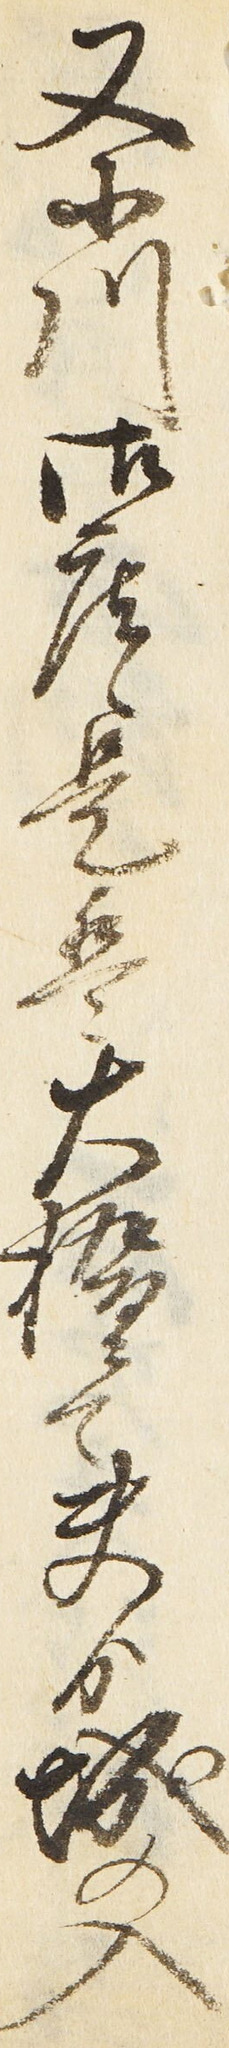又小川御座候是は大橋ニて夫ゟ城の入
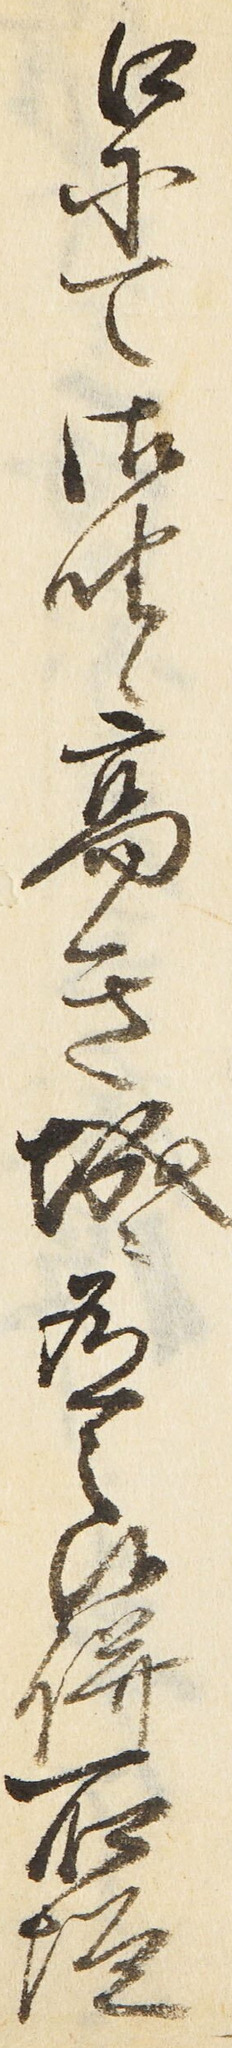口にて御坐候高き城ニ有之候併石垣
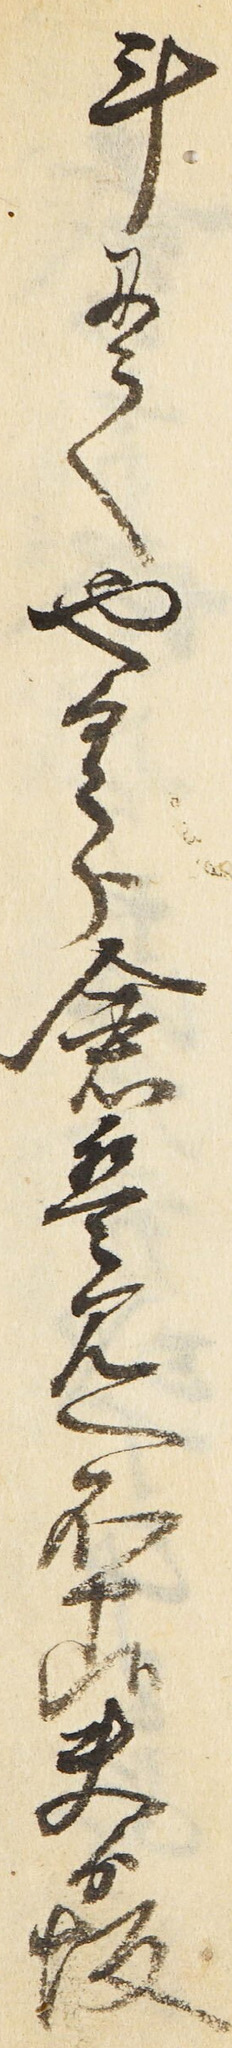計にてやくら倉は見へ不申候夫ゟ板

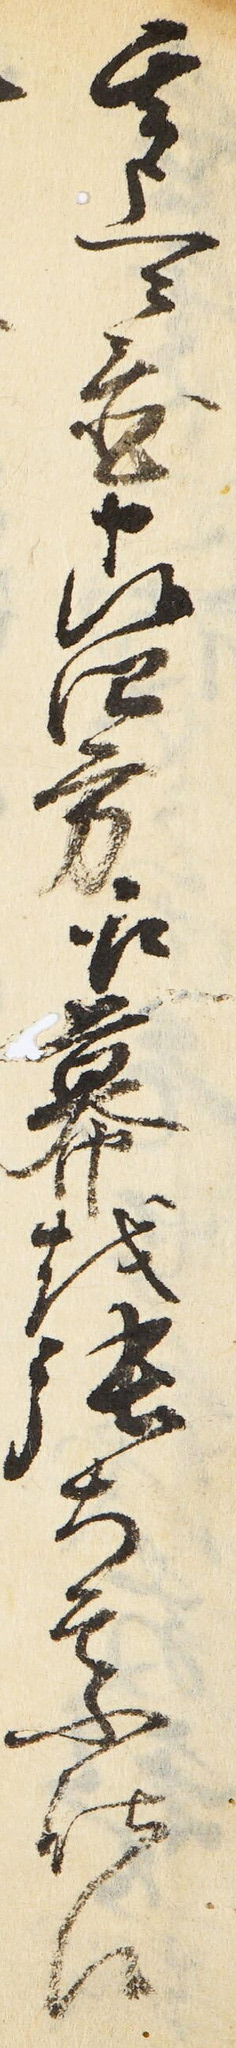其上ニ置申候四方江幕を張ちそふ仕候
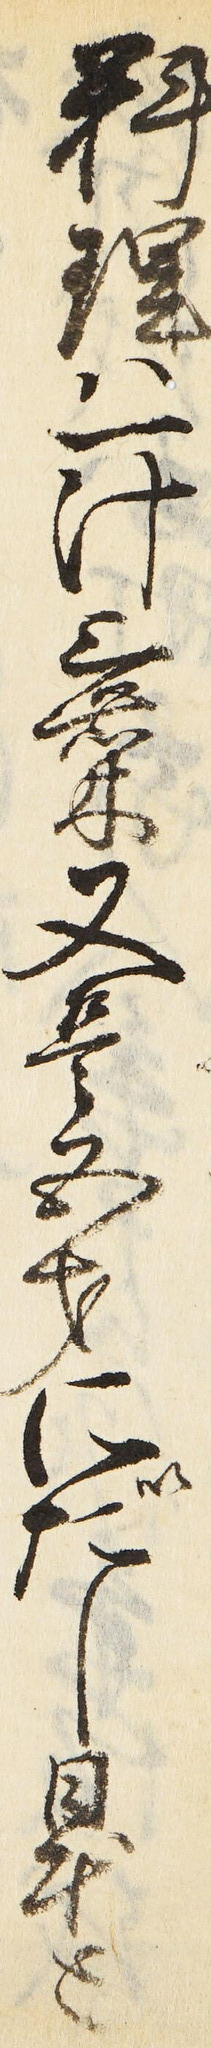料理ハ一汁三菜又は五才にいたし日本と
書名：志州鳥羽船頭外国江吹流し候一件
